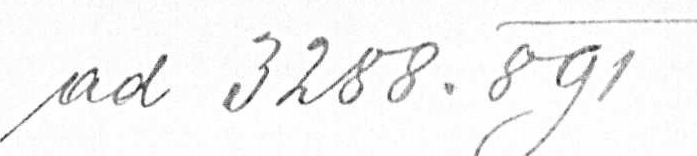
ad 3288 1891
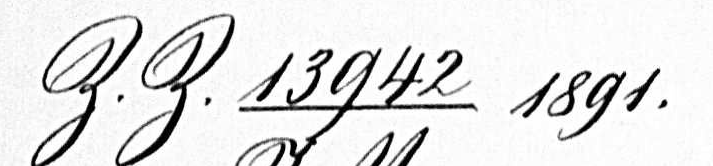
ZZ 13942 – 1891
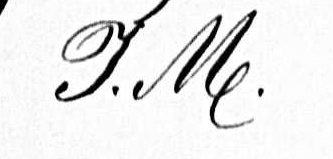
JM
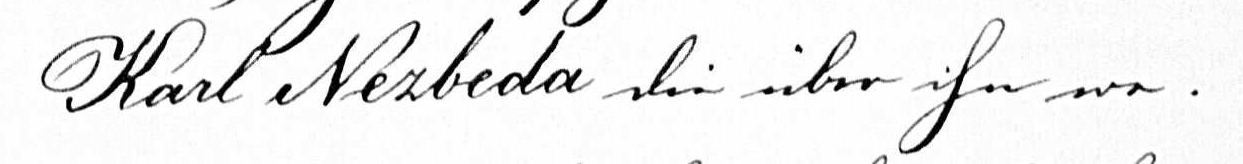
Karl Nezbeda die, über ihn we¬
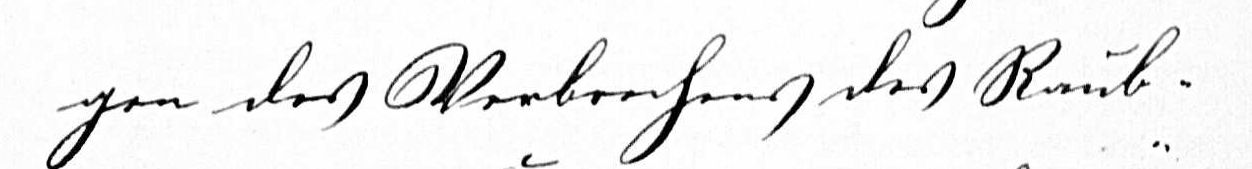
gen des Verbrechens des Raub¬
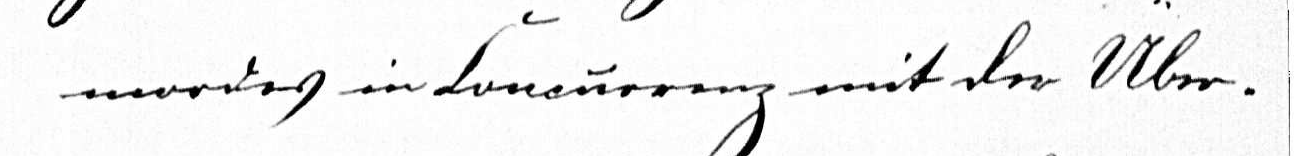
mordes in Concurrenz mit der Über¬
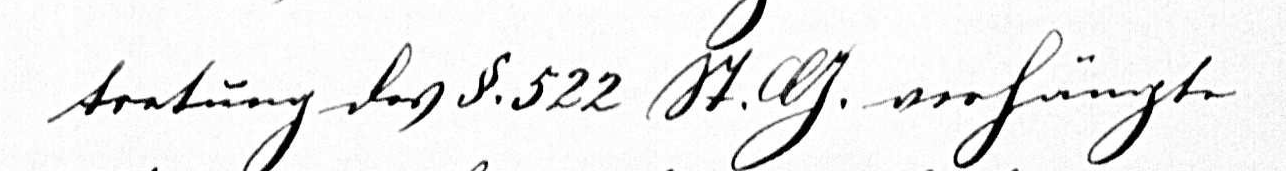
tretung des §522 St. G. verhängte
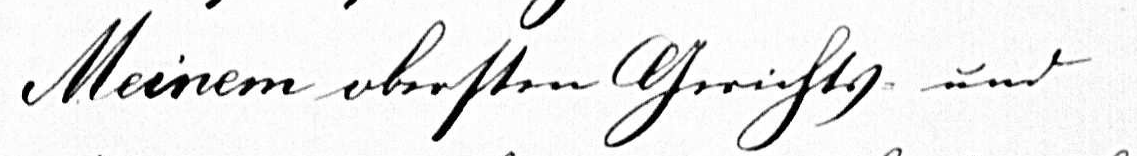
Meinem Obersten Gerichts- und
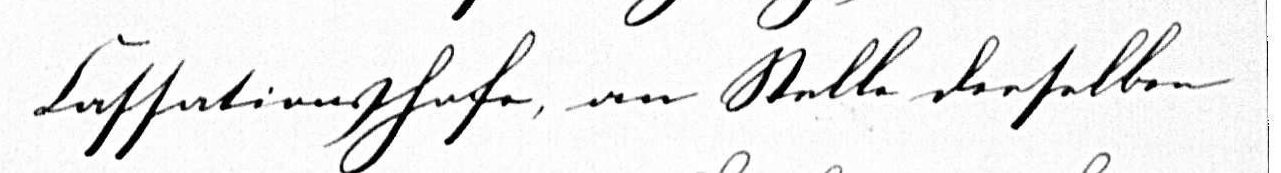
Cassationshofe, an Stelle derselben
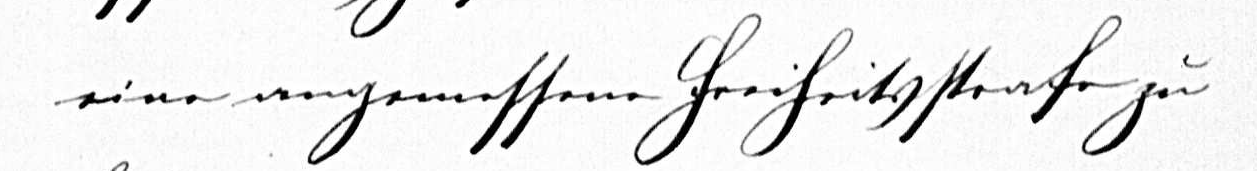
eine angemessene Freiheitsstrafe zu
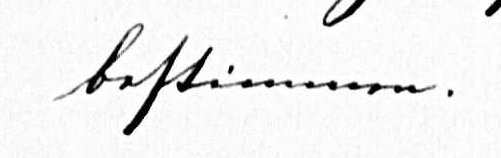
bestimmen.
